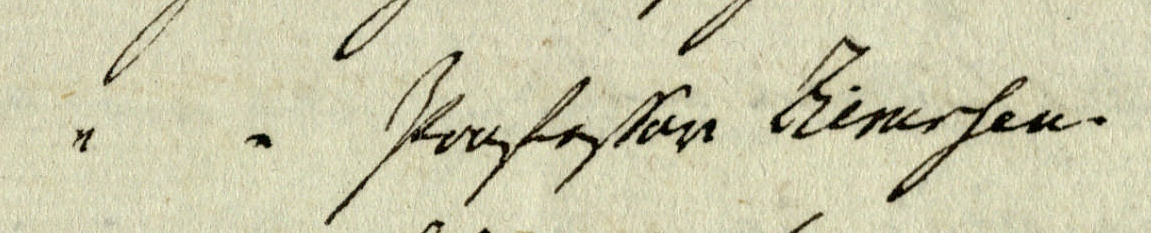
Professor Ziemssen.
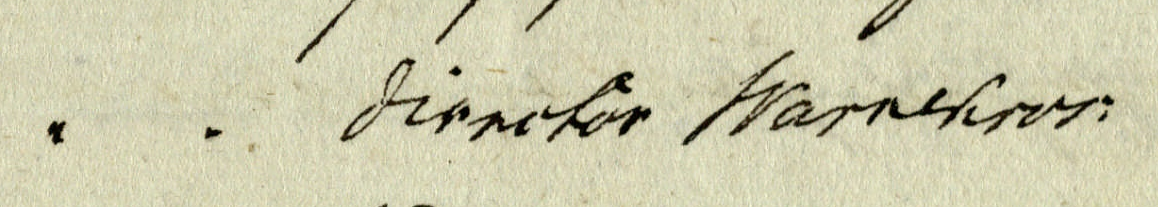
Director Warnekros
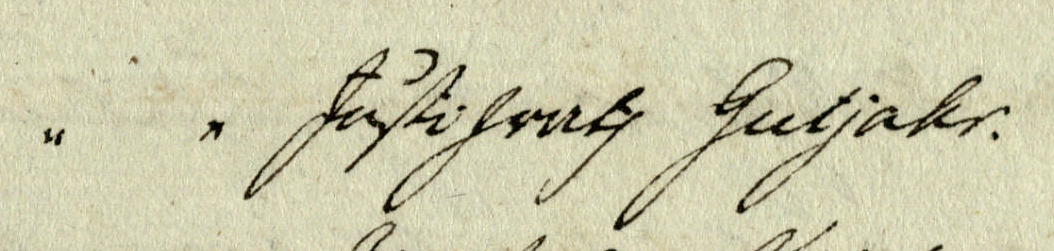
Justizrath Gutjahr.
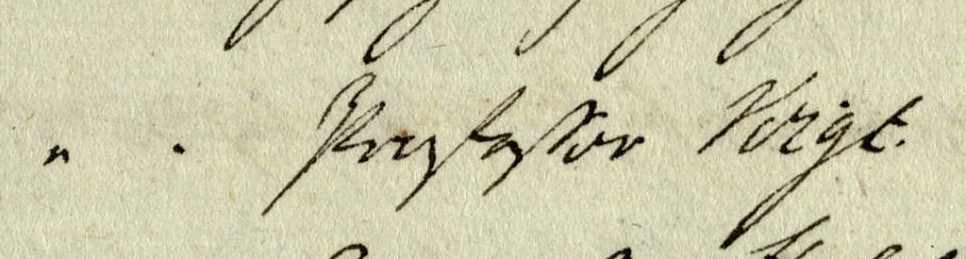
Professor Voigt.
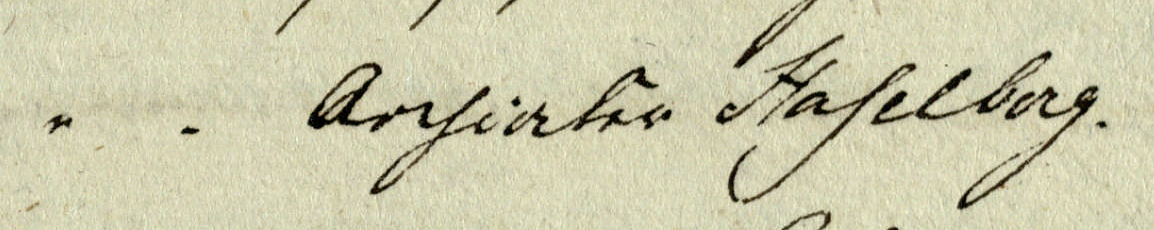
Archiater Haselberg.
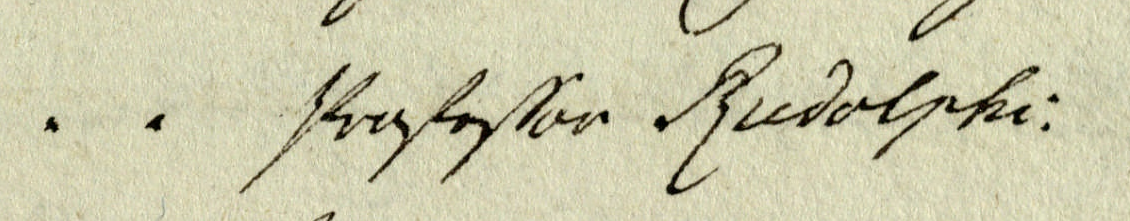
Professor Rudolphi.
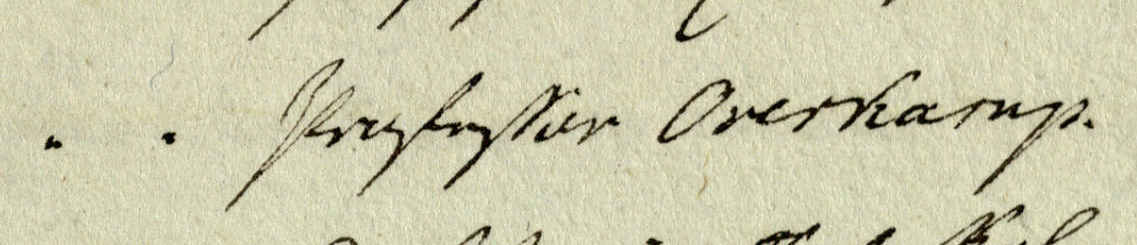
Professor Overkamp.
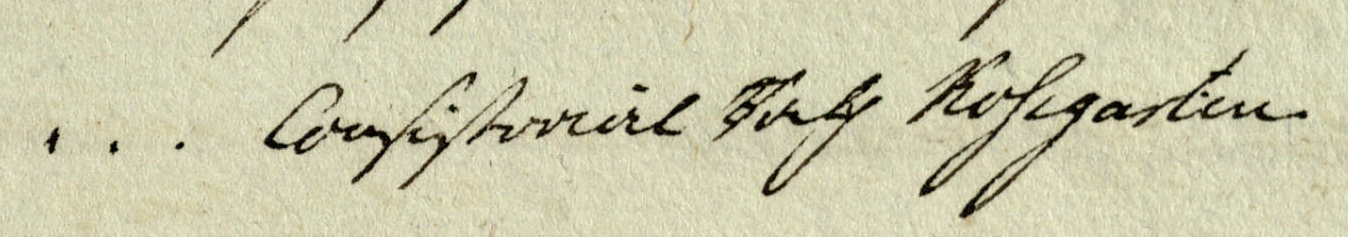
Consistorial Rath Kosegarten
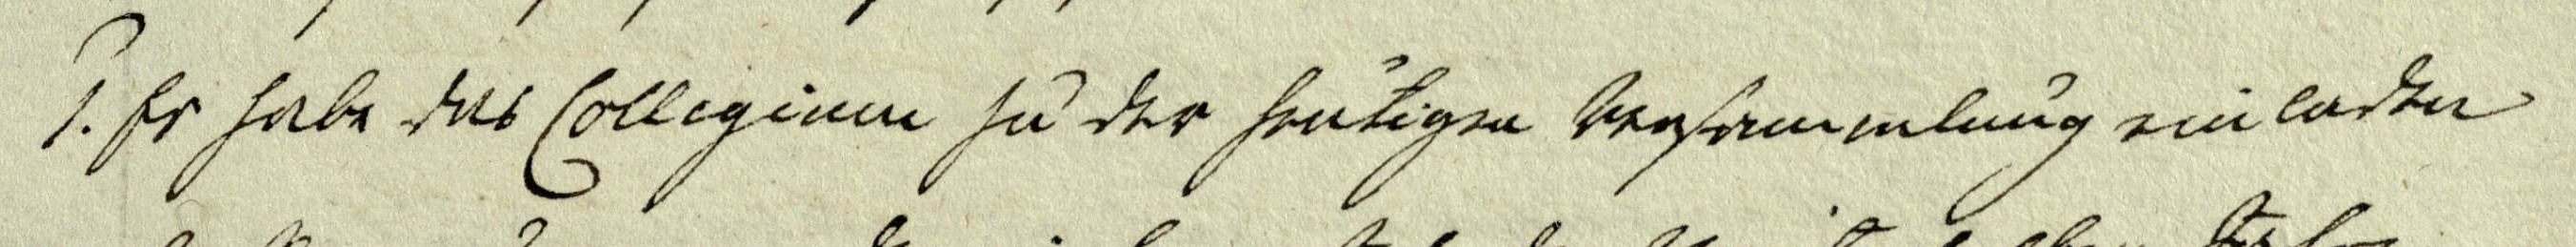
1. Er habe das Collegium zu der heutigen Versammlung einladen
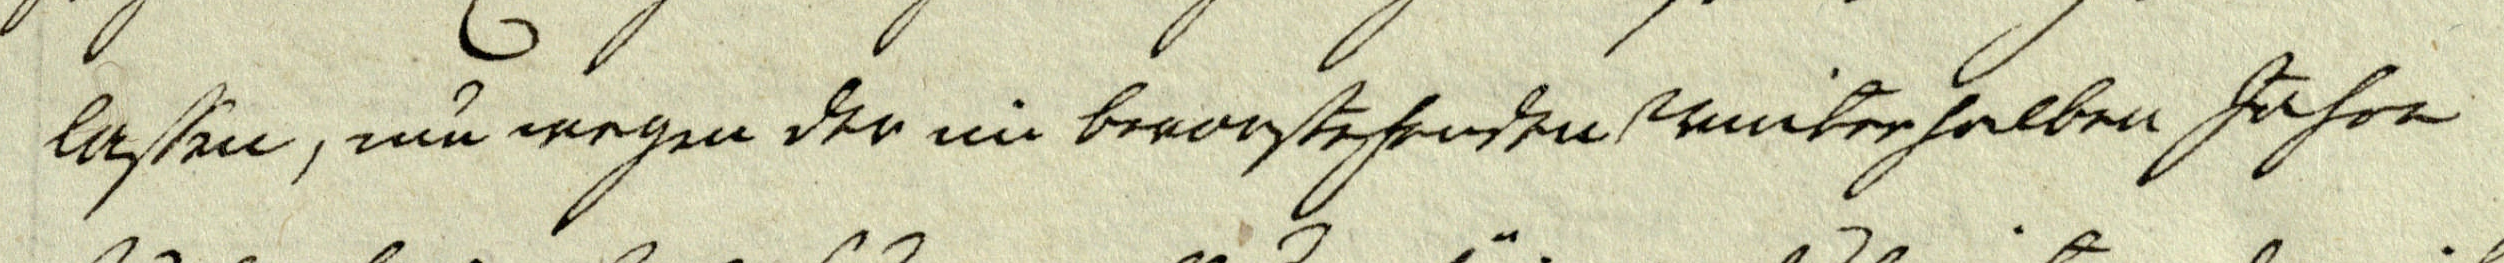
lassen, um wegen der im bevorstehenden Winterhalben Jahre
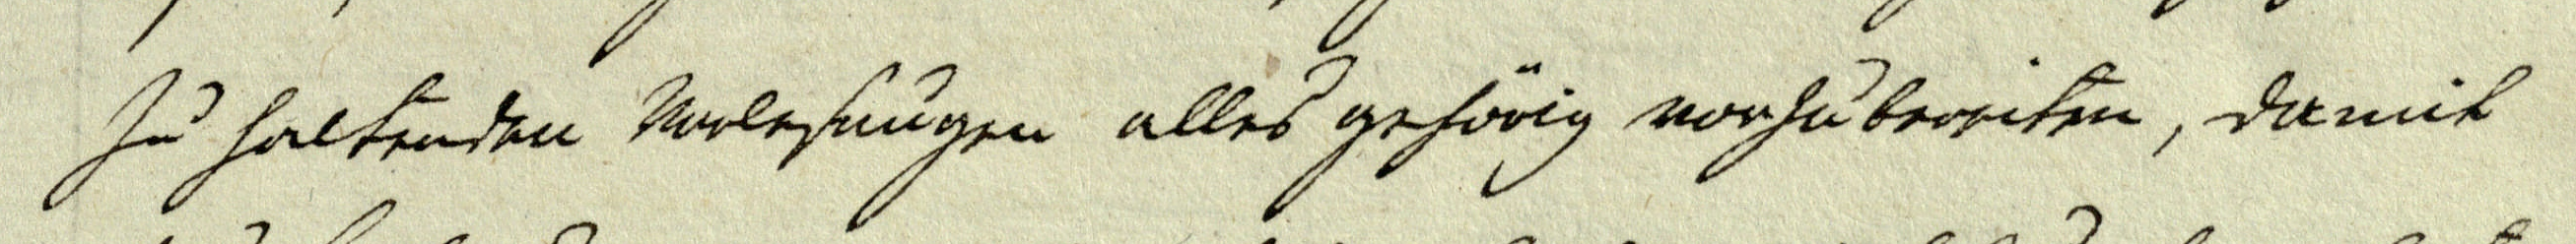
zu haltenden Vorlesungen alles gehörig vorzubereiten, damit
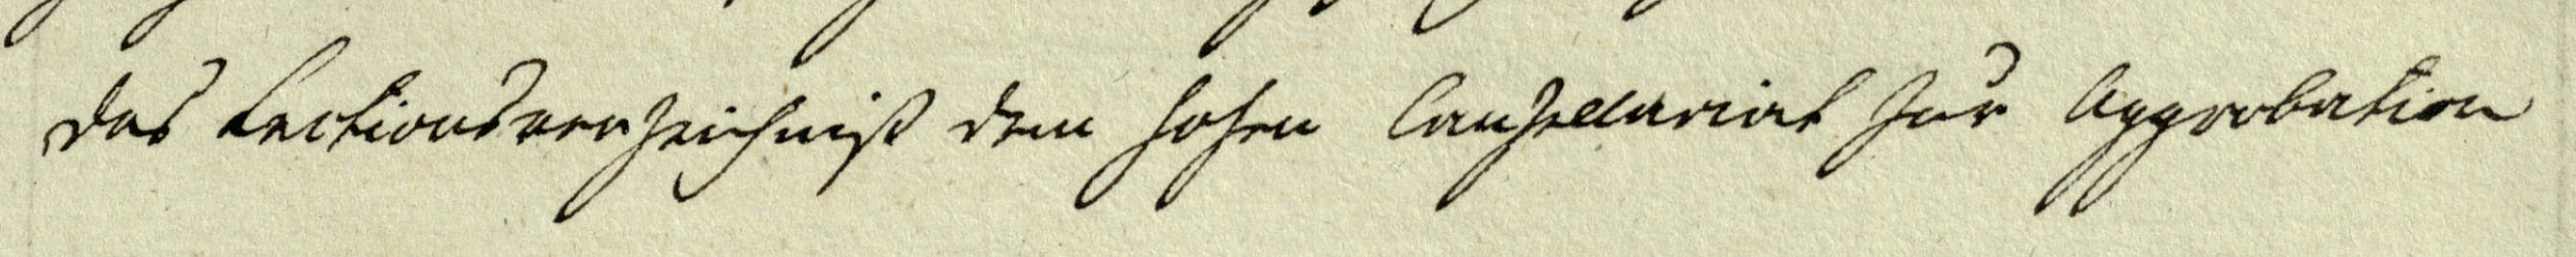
das Lectionsverzeichniß dem hohen Canzellariat zur Approbation
